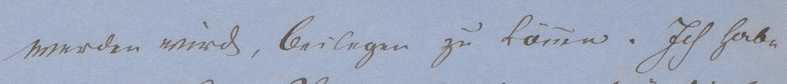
werden wird, beilegen zu können. Ich habe
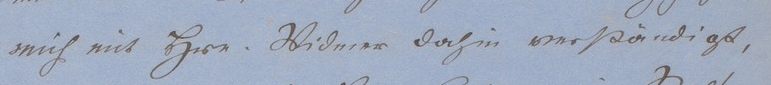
mich mit Hrn. Widmer dahin verständigt,
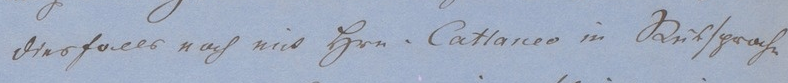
diesfalls noch mit Hrn. Cattaneo in Rüksprache
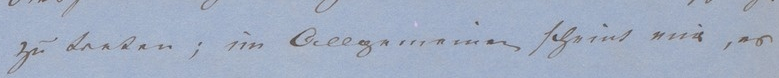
zu treten; im Allgemeinen scheint mir, es
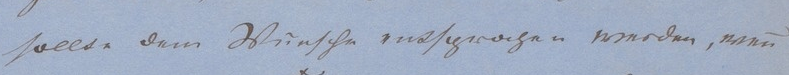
sollte dem Wunsche entsprochen werden, wenn
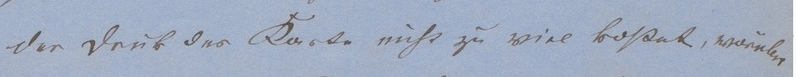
der Druck der Karte nicht zu viel kostet, worüber
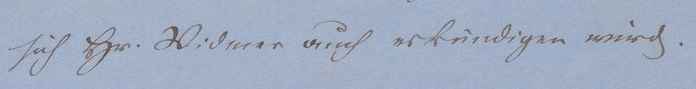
sich Hr. Widmer auch erkundigen wird. –
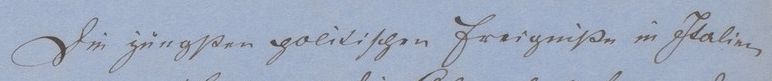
Die jüngsten politischen Ereigniße in Italien
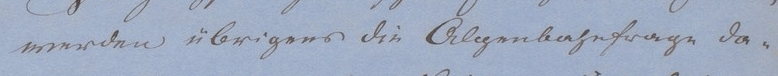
werden übrigens die Alpenbahnfrage da-
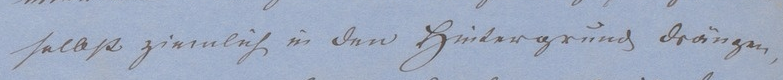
selbst ziemlich in den Hintergrund drängen,
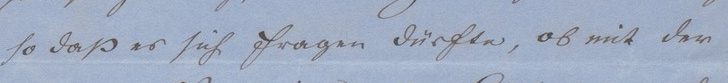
so daß es sich fragen dürfte, ob mit der
